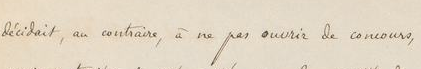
décidait, au contraire, à ne pas ouvrir de concours,
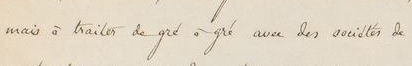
mais à traiter de gré à gré avec des sociétés de
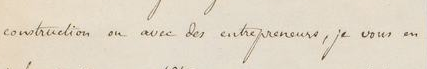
construction ou avec des entrepreneurs, je vous en
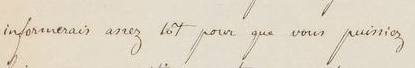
informerais assez tôt pour que vous puissiez
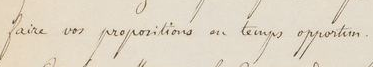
faire vos propositions en temps opportun.
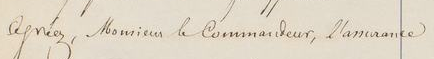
Agréez, Monsieur le Commandeur, l'assurance
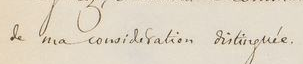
de ma considération distinguée.
